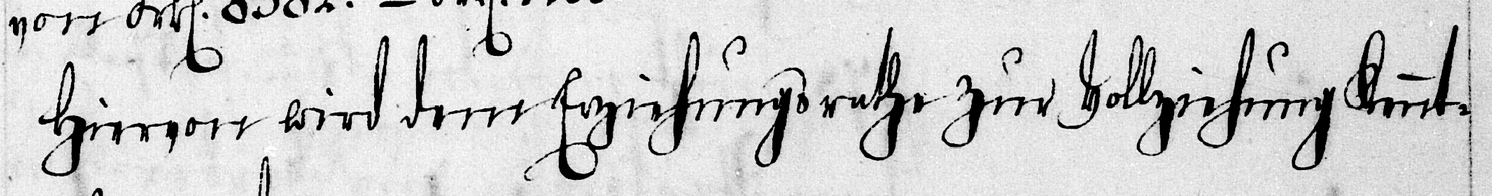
Hiervon wird dem Erziehungsrathe zur Vollziehung Kennt¬
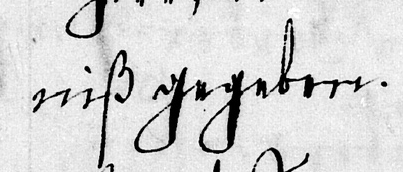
niß gegeben.
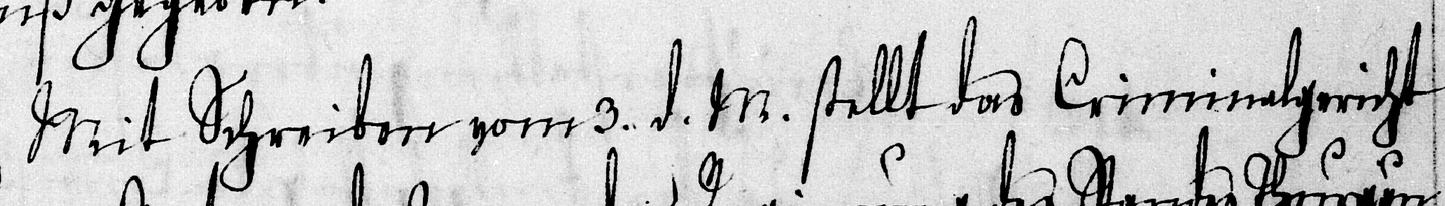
Mit Schreiben vom 3. d. M. stellt das Criminalgericht
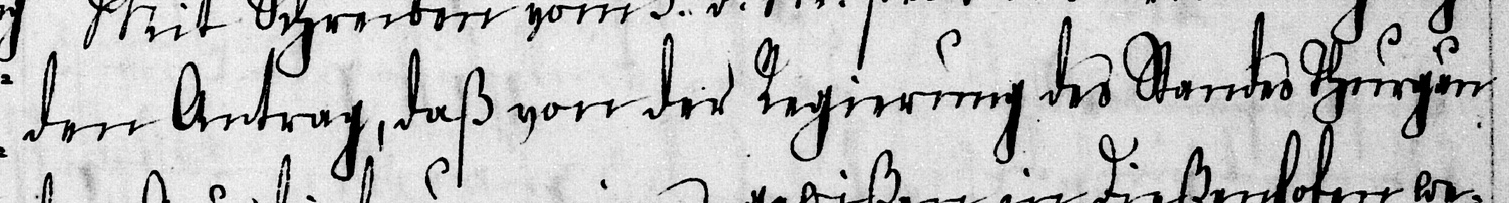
den Antrag, daß von der Regierung des Standes Thurgau
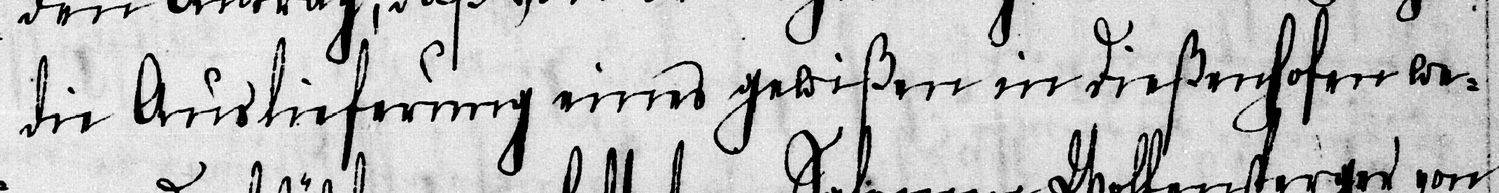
die Auslieferung eines gewißen in Dießenhofen we¬
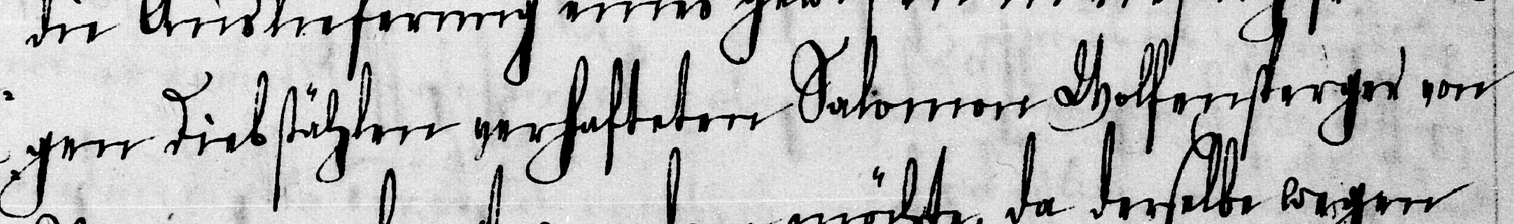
gen Diebstählen verhafteten Salomon Wolfensperger von
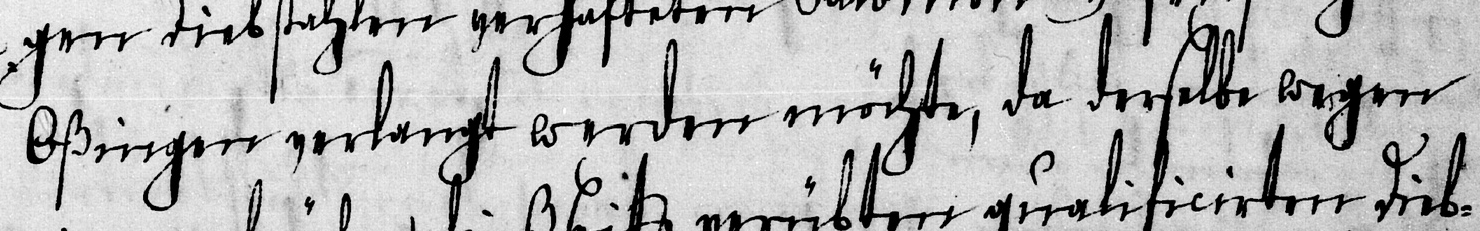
Oßingen verlangt werden möchte, da derselbe wegen
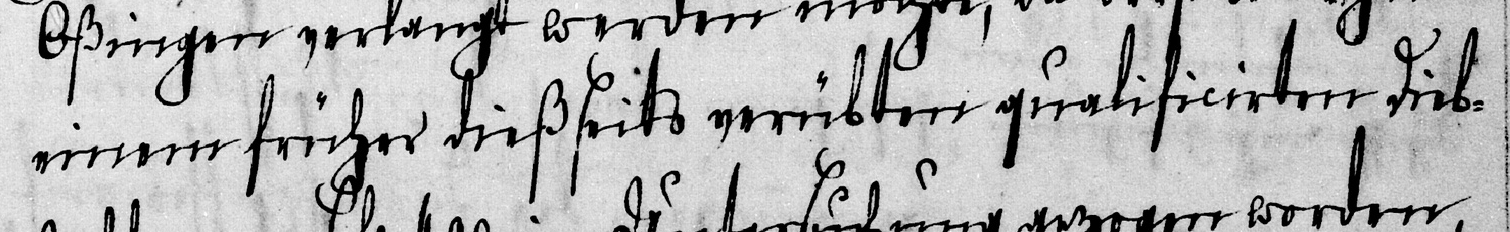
einem früher dießseits verübten qualificirten Dieb¬
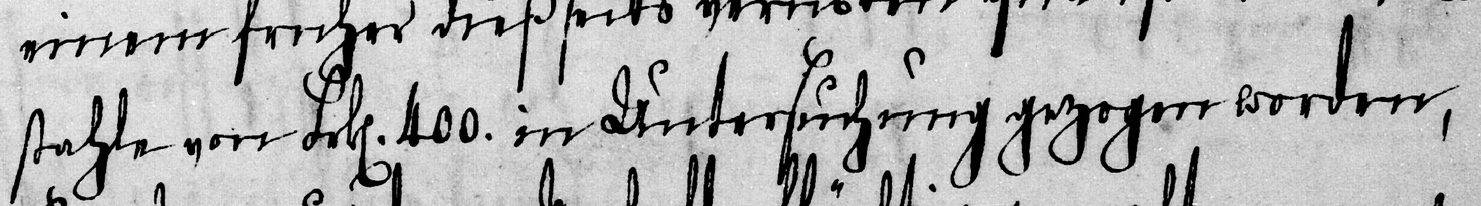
stahle von Frk[en]. 400. in Untersuchung gezogen worden,
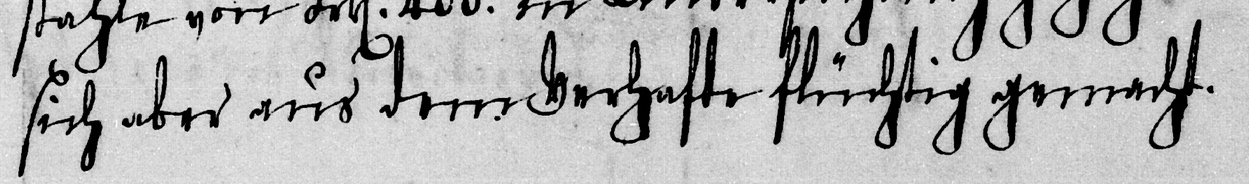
sich aber aus dem Verhafte flüchtig gemacht.
